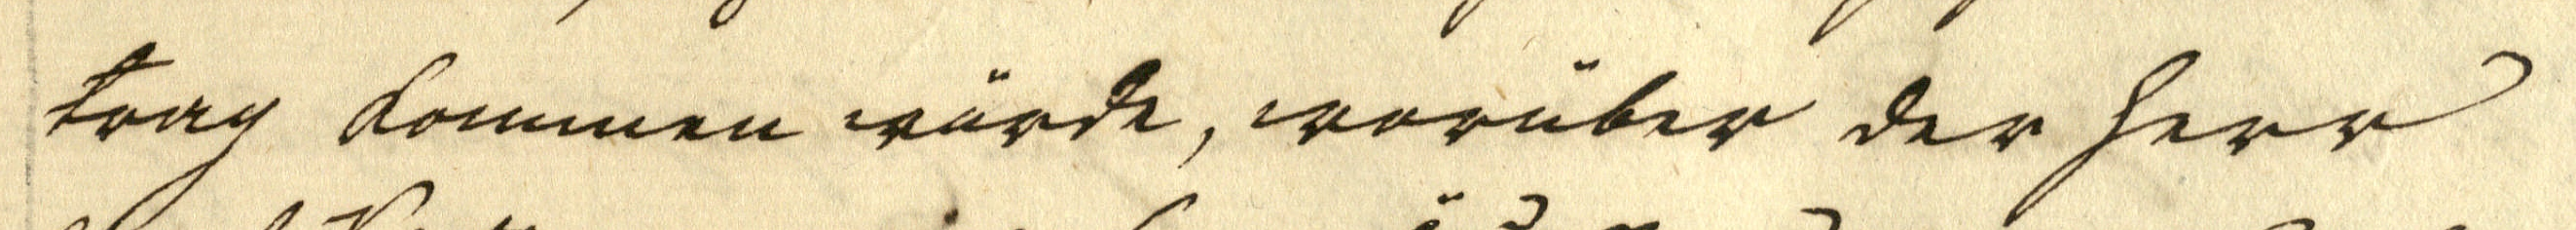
trag kommen würde, worüber der herr
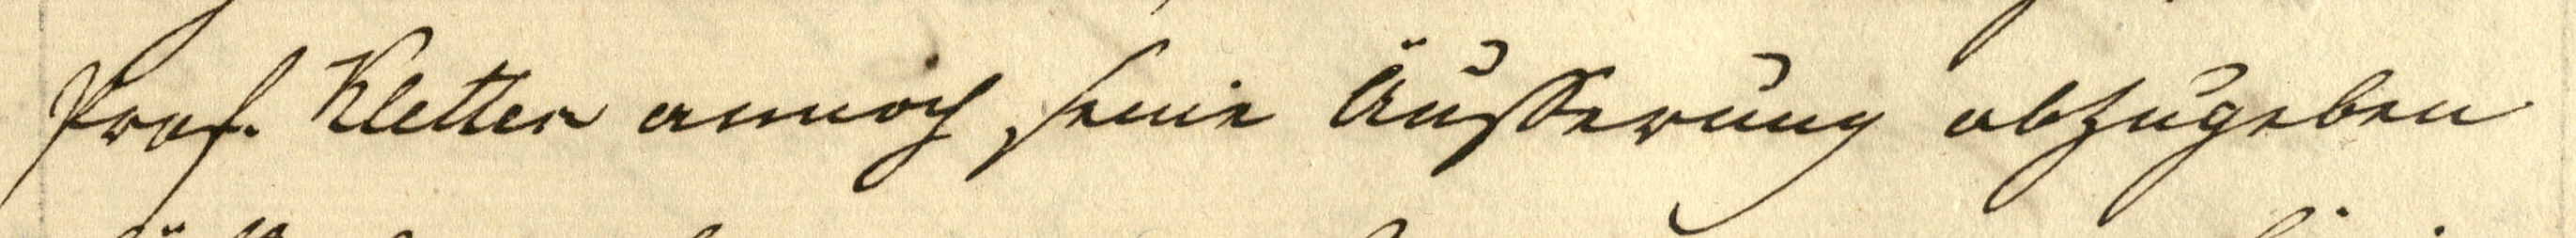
Prof. Kletten annoch seine Äusserung abzugeben
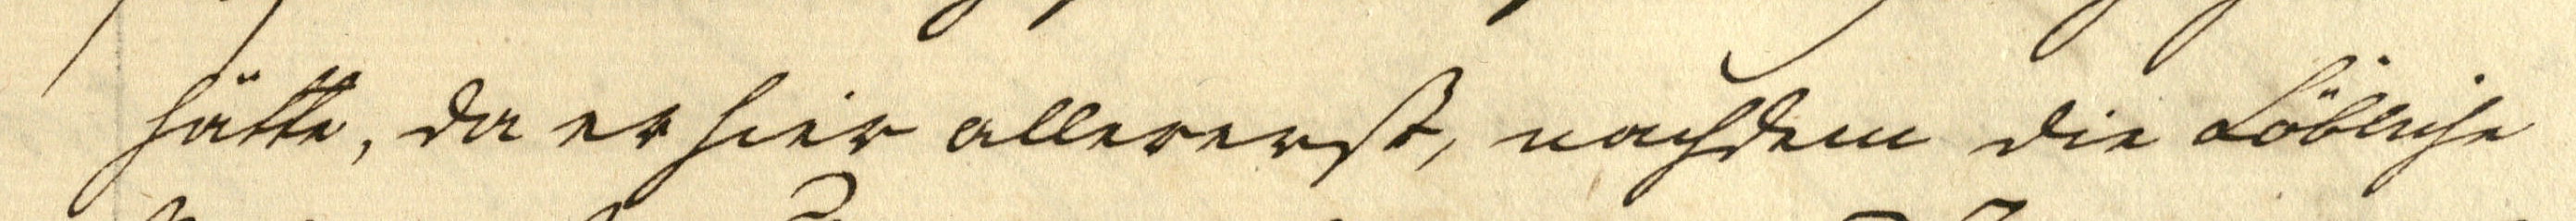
hätte, da er hier allererst, nachdem die Löbliche
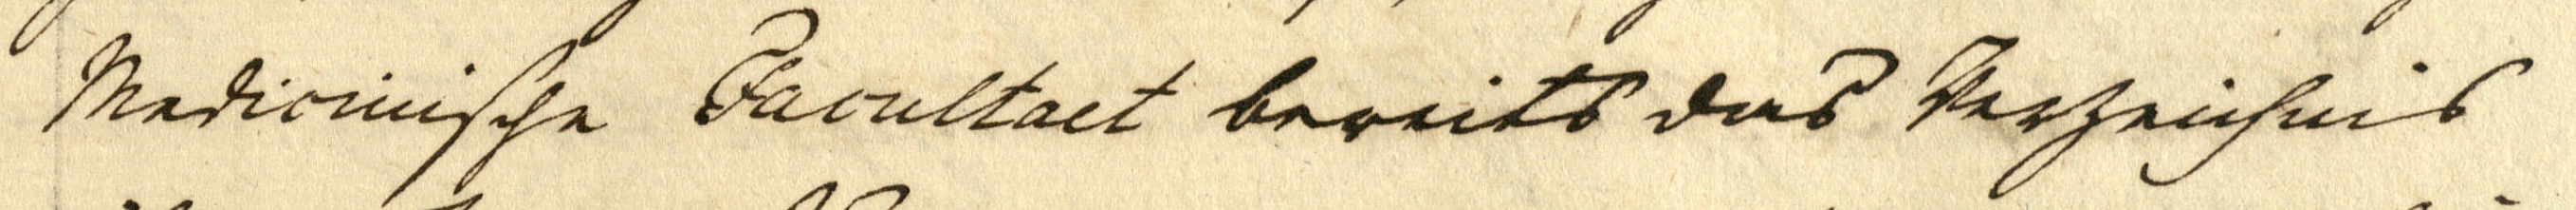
Medicinische Facultaet bereits das Verzeichnis
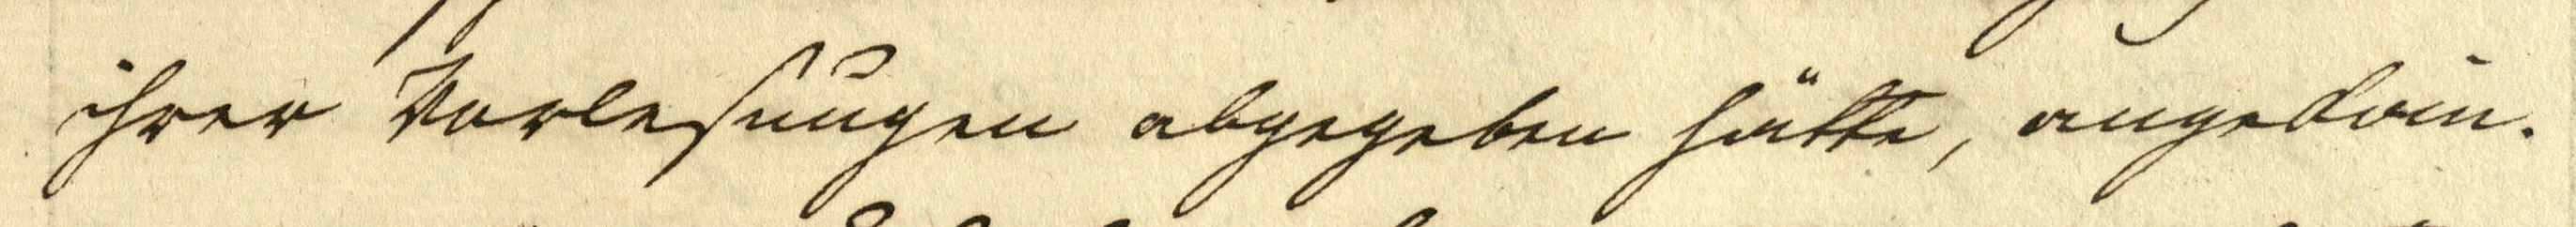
ihrer Vorlesungen abgegeben hätte, angekom-
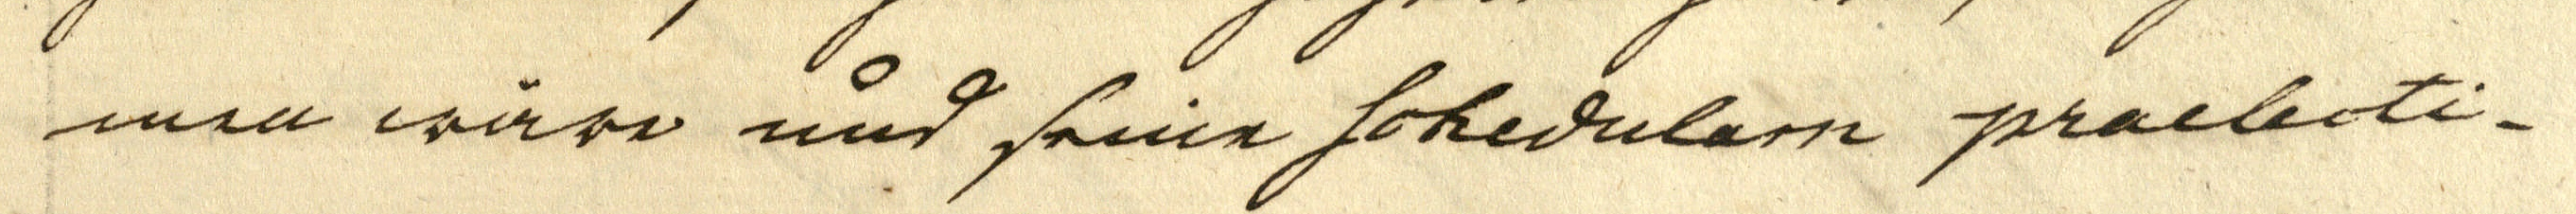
men wäre und seine Schedulam praelecti-
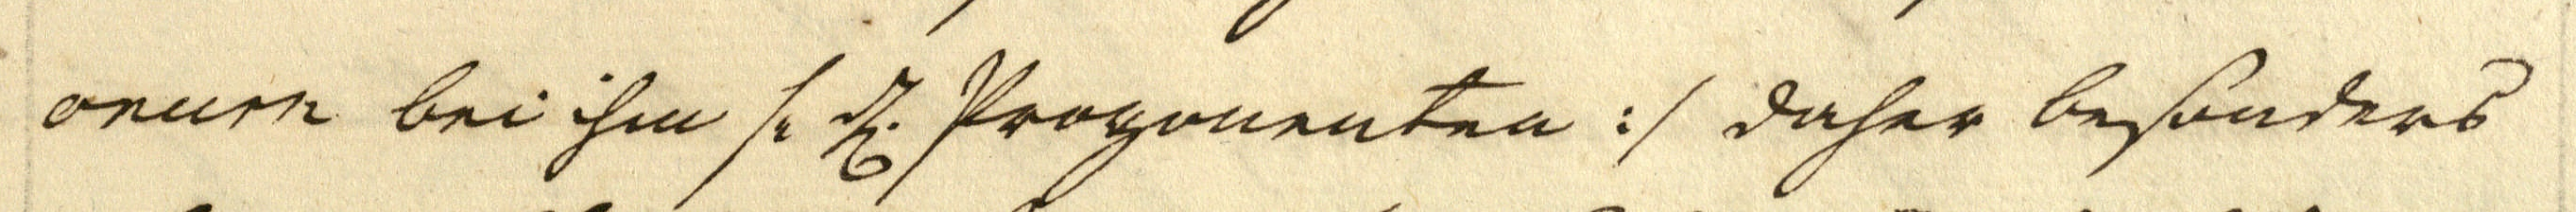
onum bei ihm ( dh. Proponenten) daher besonders
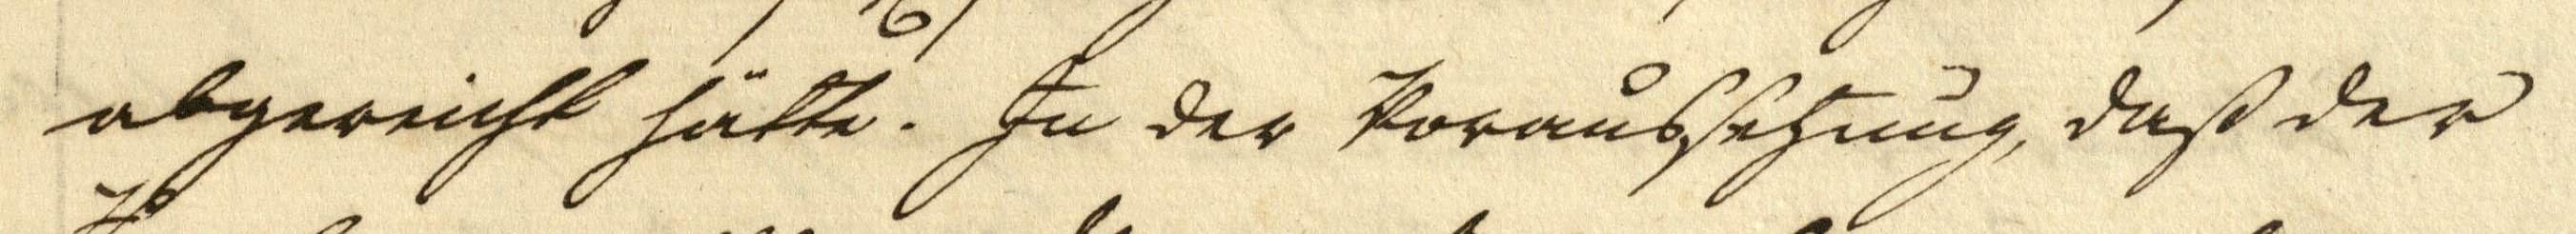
abgereicht hätte. In der Voraussetzung, daß der
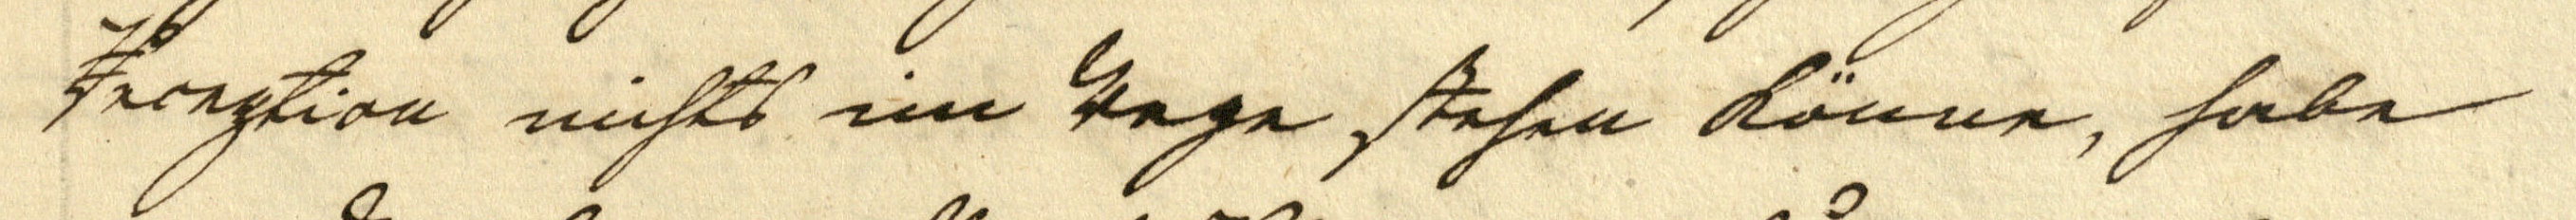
Reception nichts im Wege stehen könne, habe
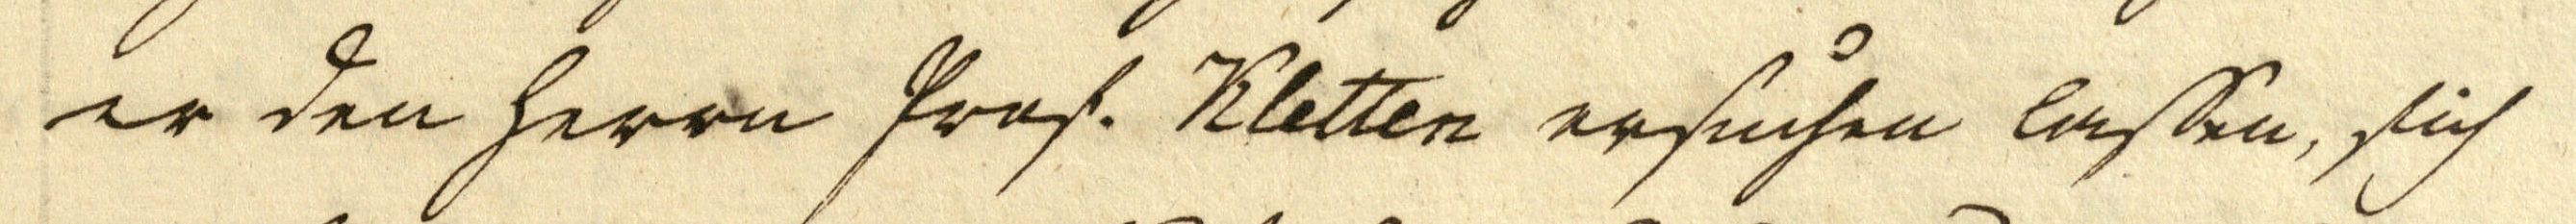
er den herrn Prof. Kletten ersuchen lassen, sich
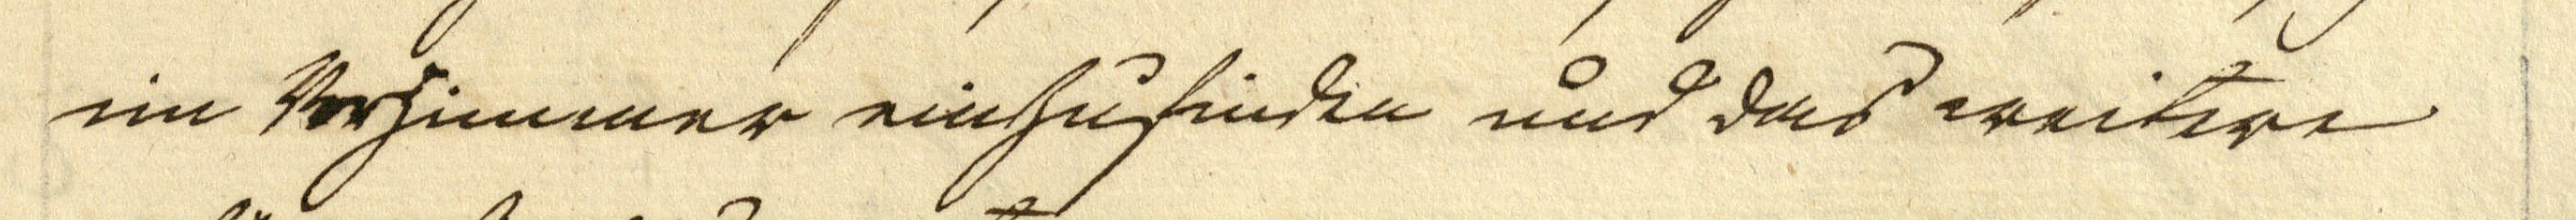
im Vorzimmer einzufinden und das weitere
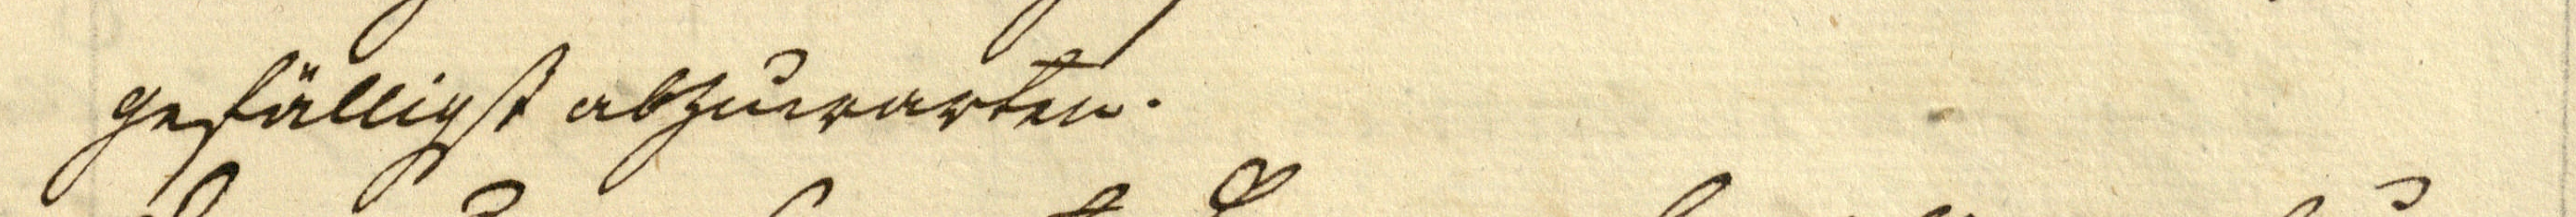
gefälligst abzuwarten.
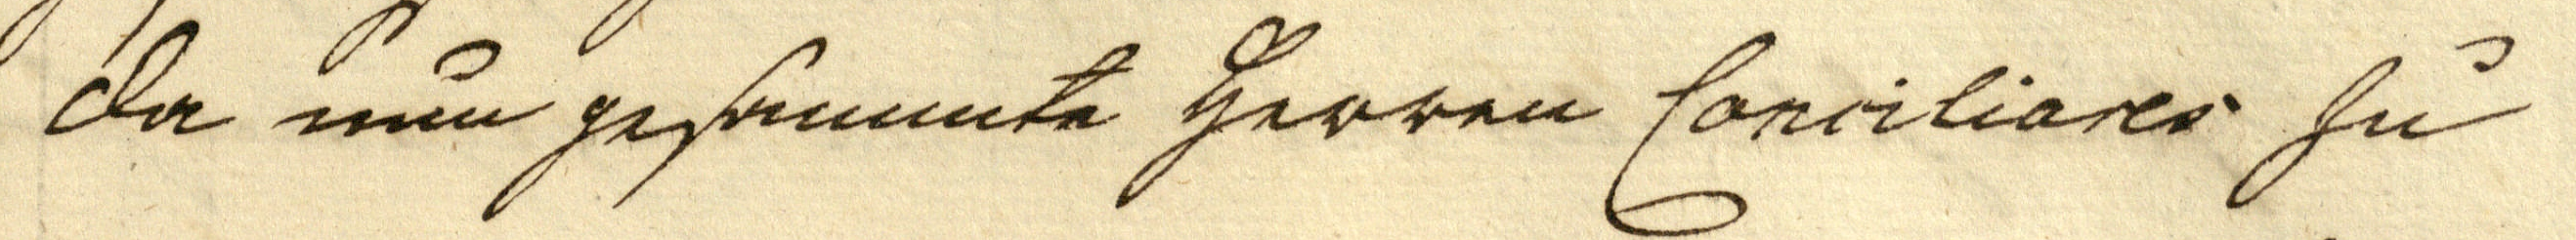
Da nun gesammte Herren Conciliares zu
